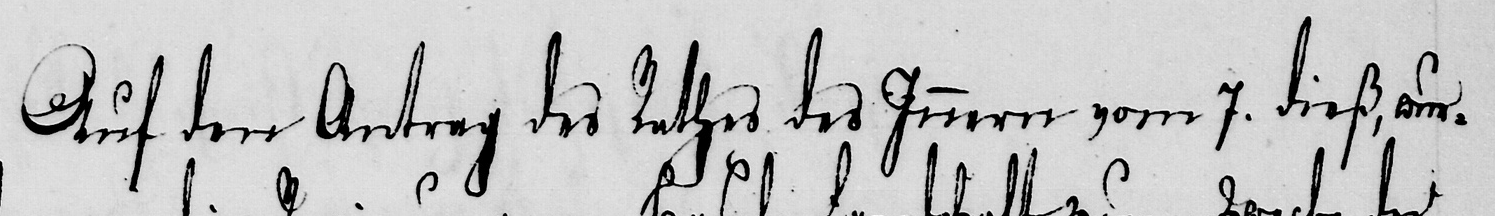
Auf den Antrag des Rathes des Innern vom 7. dieß, wu¬
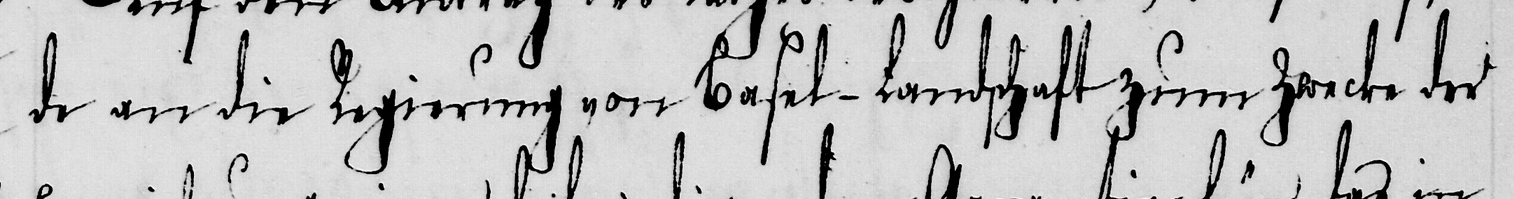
rde an die Regierung von Basel-Landschaft zum Zwecke der
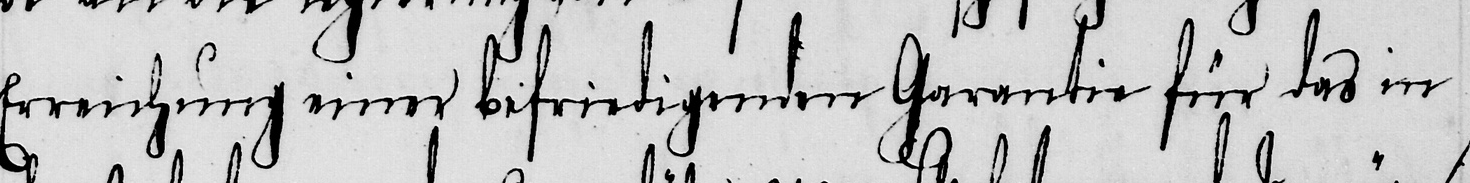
reichung einer befriedigenden Garantie für das in
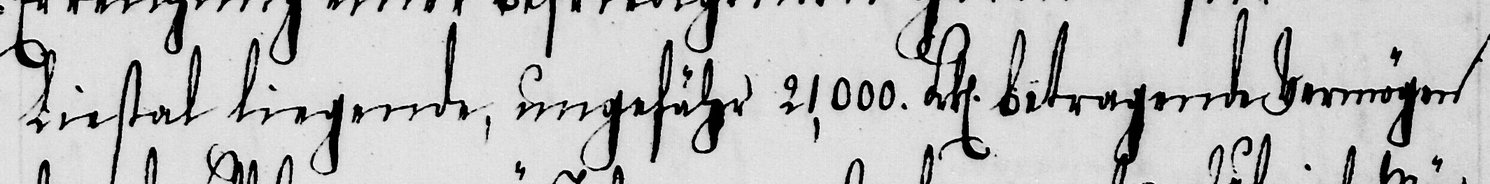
Liestal liegende, ungefähr 21,000. Frk[en]. betragen¬
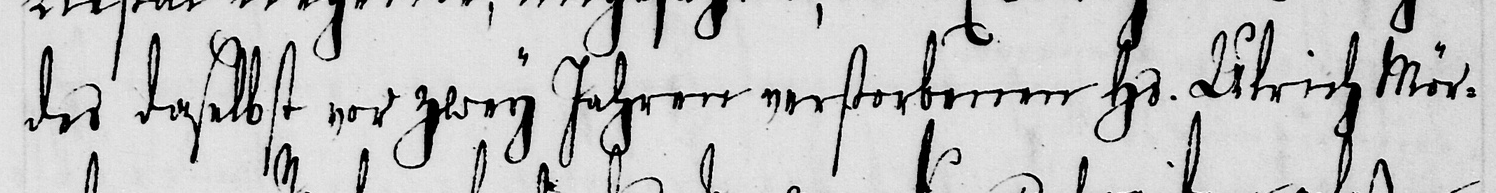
des daselbst vor zwey Jahren verstorbenen Hs. Ulrich Mör¬
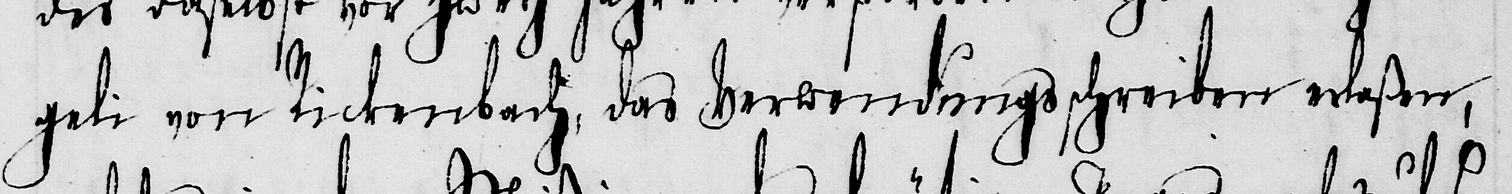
geli von Rickenbach, das Verwendungsschreiben erlaßen,
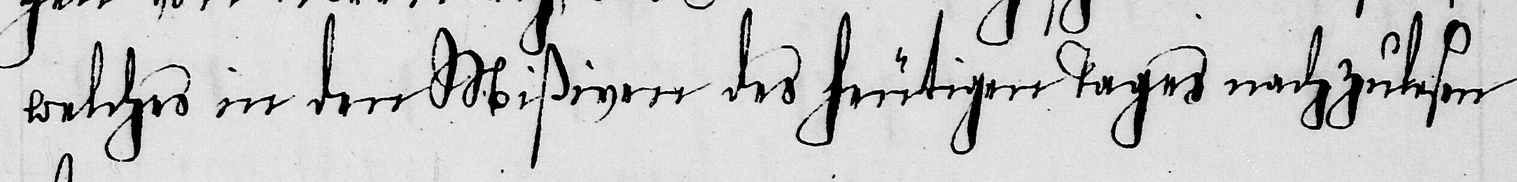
welches in den Mißiven des heutigen Tages nachzulesen
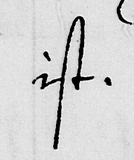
ist.
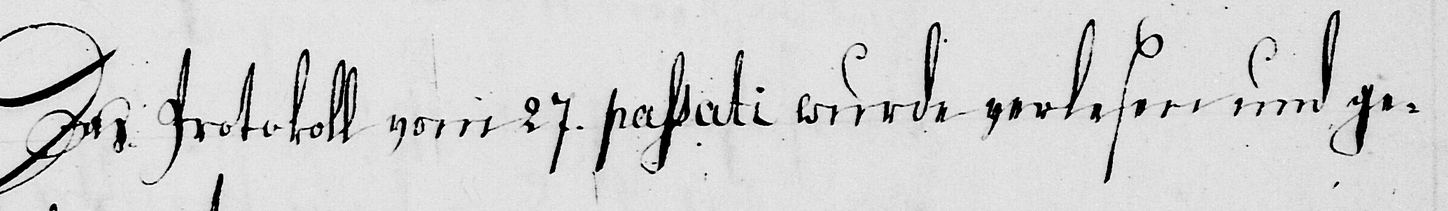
Das Protokoll vom 27. passati wurde verlesen und ge¬
